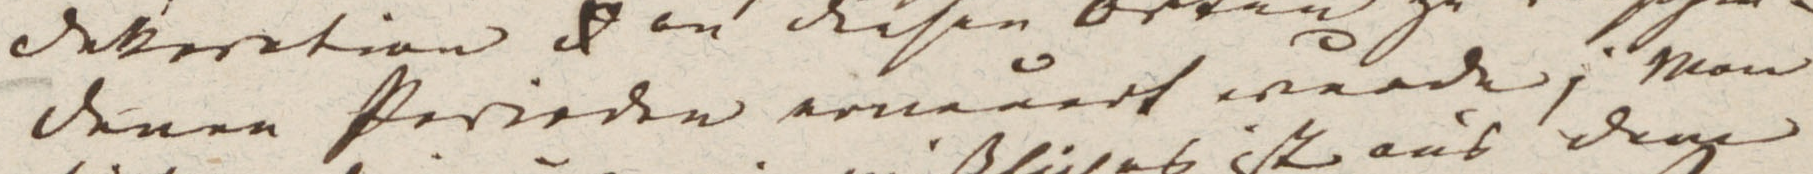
denen Perioden erneuert wurde; Man
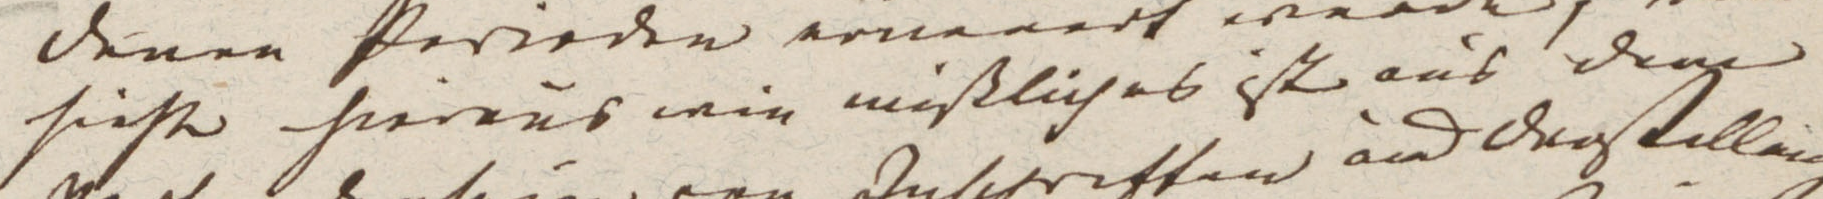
sieht hieraus wie misslich es ist aus dem
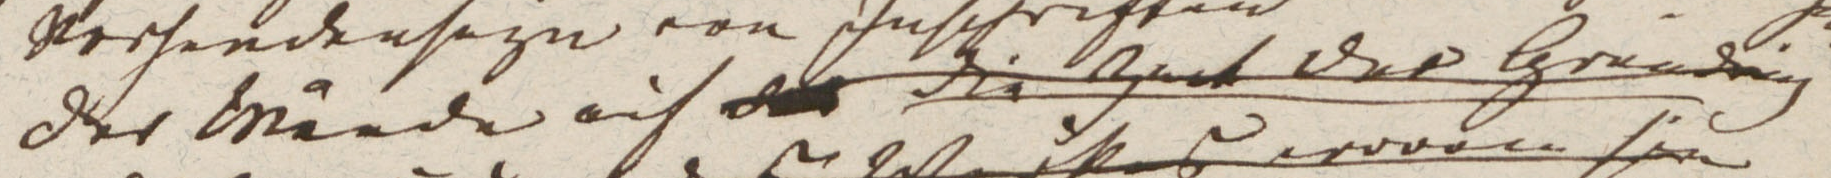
der Wände auf das die Zeit der Gründung
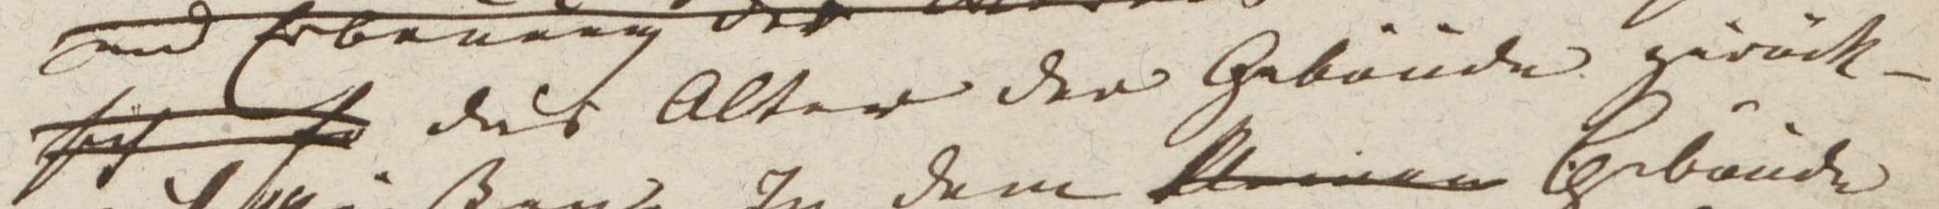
sich f das Alter der Gebäude zurück-
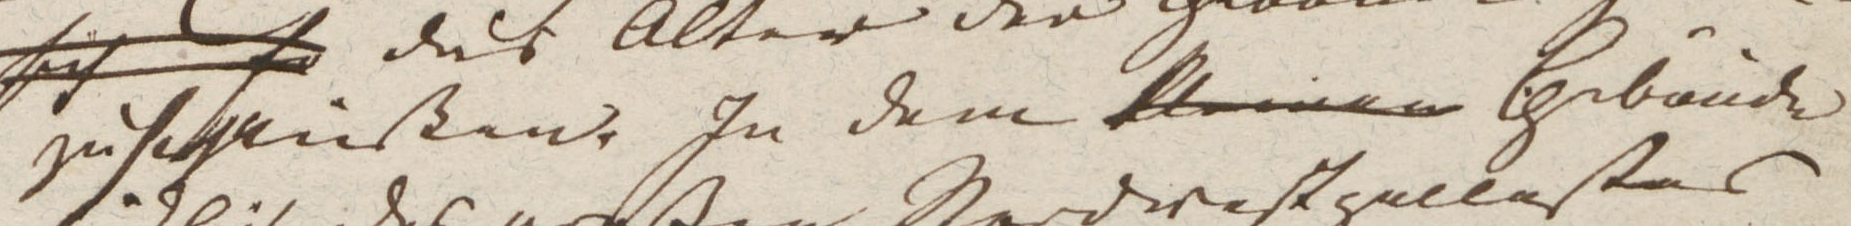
zuschliessen. In dem kleinen Gebäude
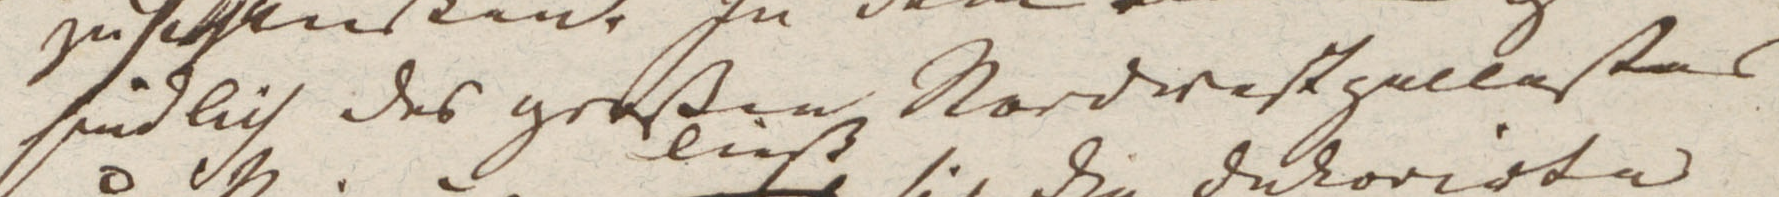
südlich des grossen Nordwestpallastes
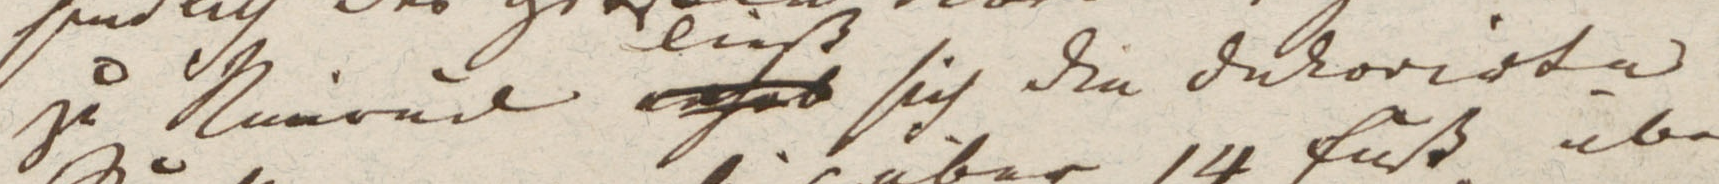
zu Nimrud erhob liess sich die dekorirte
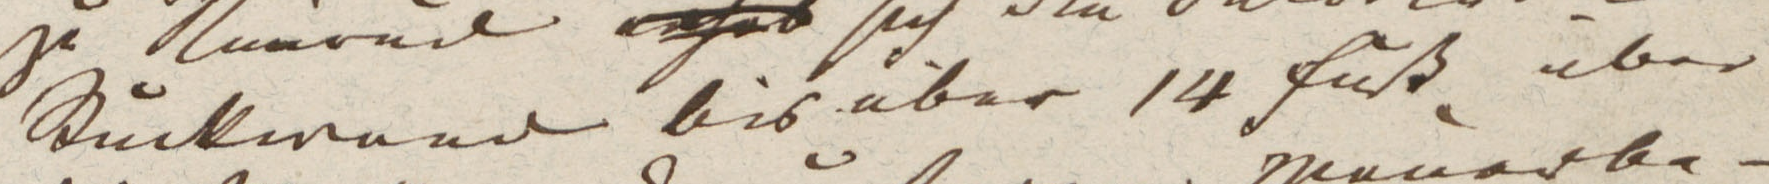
Stuckwand bis über 14 Fuss über
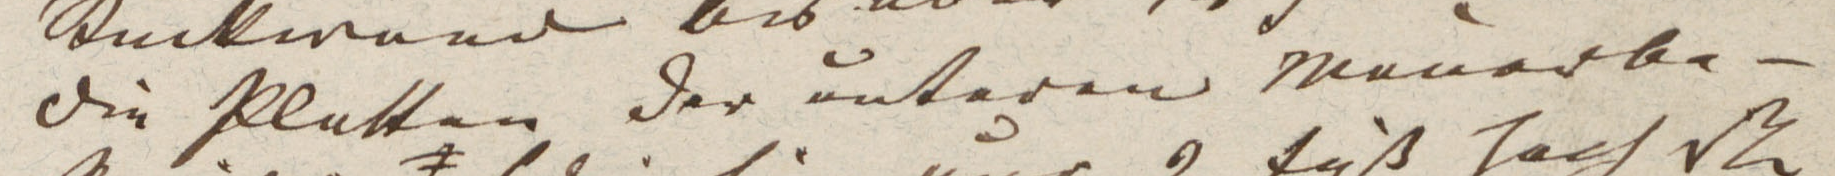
die Platten der unteren Mauerbe-
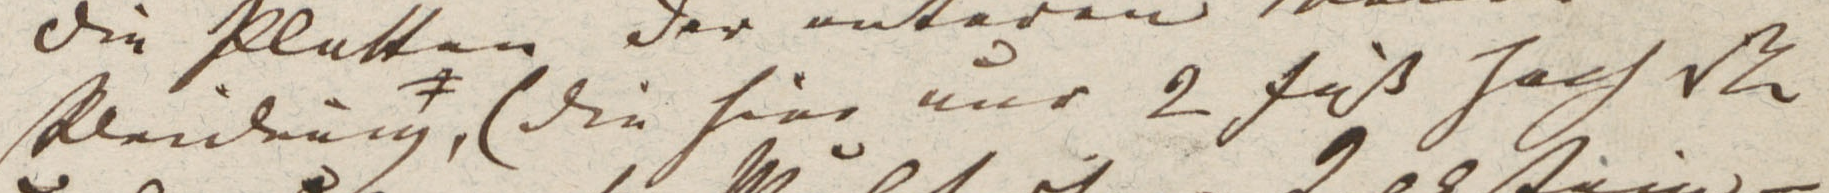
kleidung %, (die hier nur 2 Fuss hoch ist
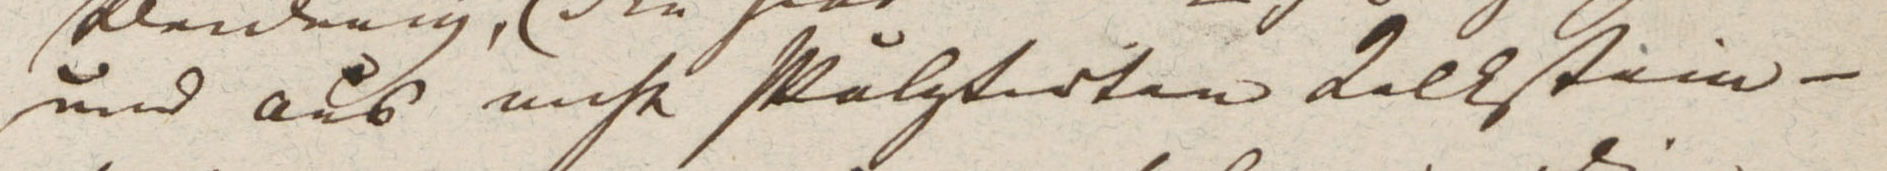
und aus nicht skulptirten Kalkstein-
